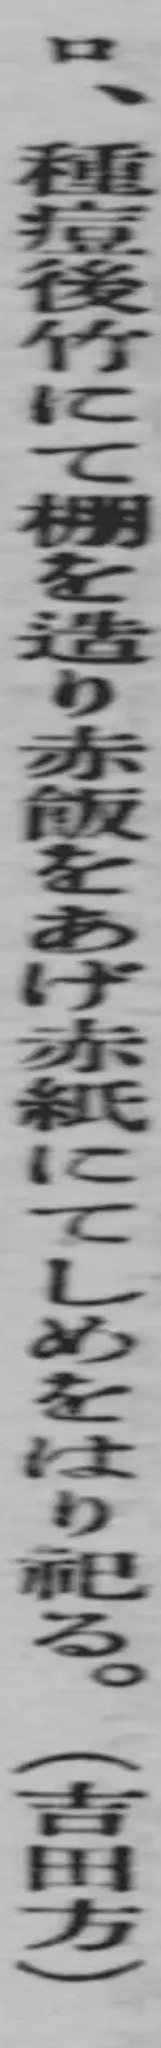ロ、種痘後竹にて棚を造り赤飯をあげ赤紙にてしめをはり祀る。(吉田方)
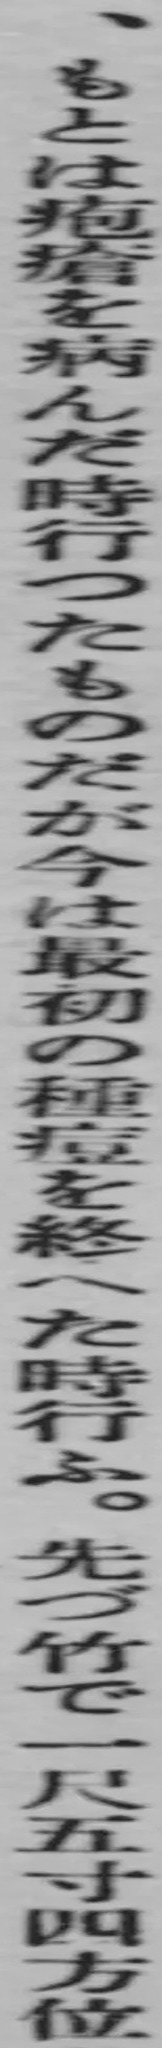ハ、もとは疱瘡を病んだ時行つたものだが今は最初の種痘を終へた時行ふ。先づ竹で一尺五寸四方位の
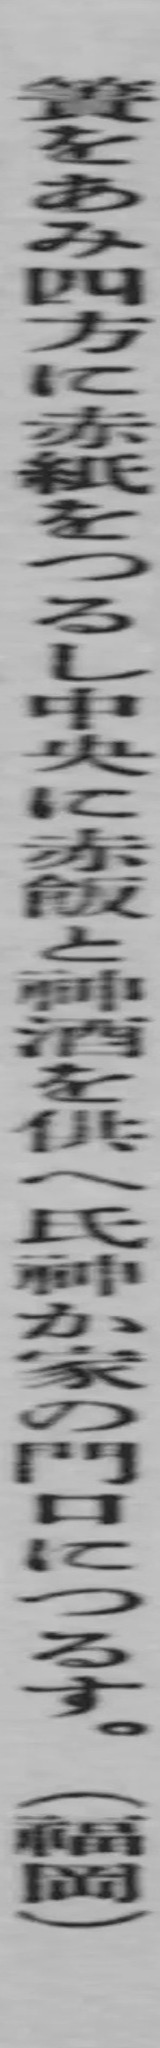簀をあみ四方に赤紙をつるし中央に赤飯と神酒を供へ氏神か家の門口につるす。(福岡)
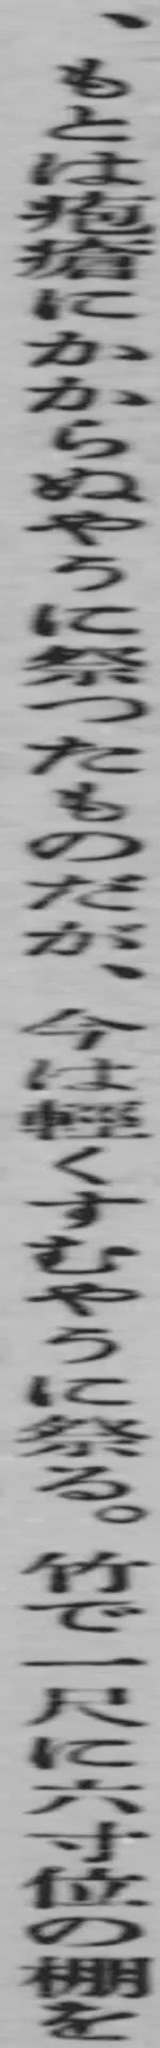ニ、もとは疱瘡にかからぬやうに祭つたものだが、今は輕くすむやうに祭る。竹で一尺に六寸位の棚を
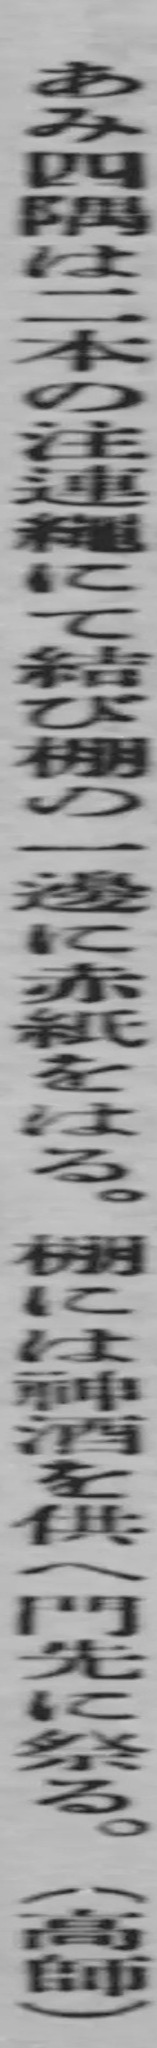あみ四隅は二本の注連繩にて結び棚の一邊に赤紙をはる。棚には神酒を供へ門先に祭る。(高師)
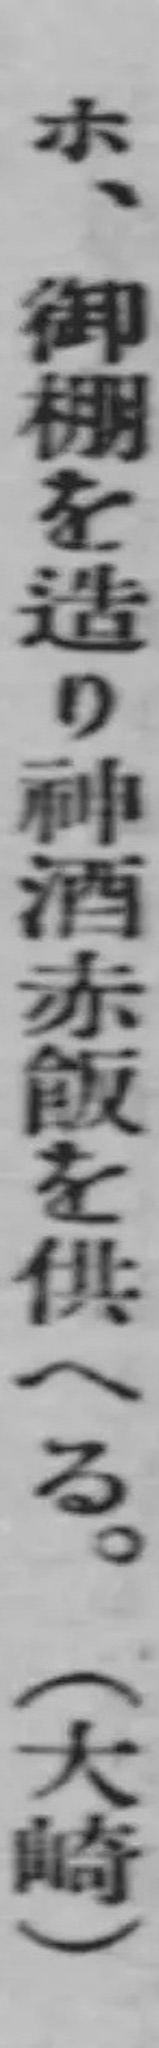ホ、御棚を造り神酒赤飯を供へる。(大崎)
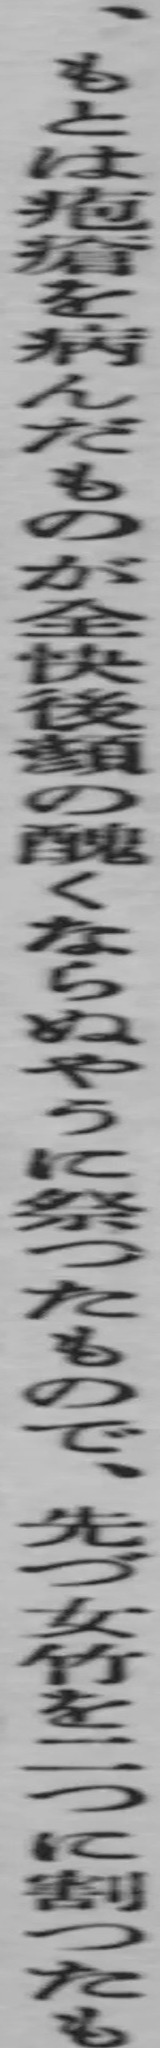ヘ、もとは疱瘡を病んだものが全快後顏の醜くならぬやうに祭つたもので、先づ女竹を二つに割つたも
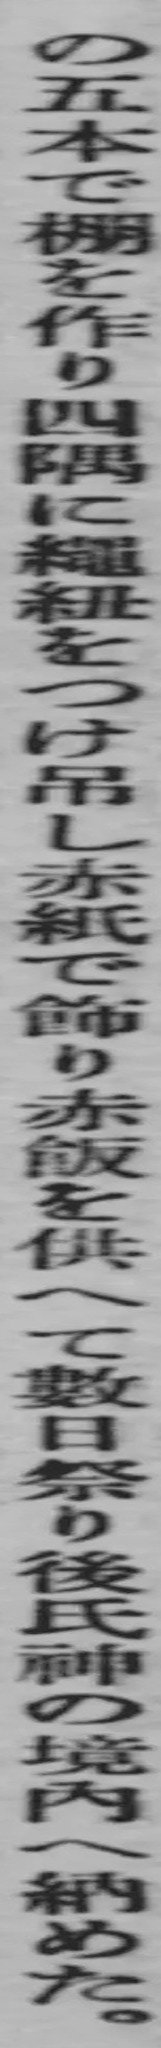の五本で棚を作り四隅に繩紐をつけ吊し赤紙で飾り赤飯を供へて數日祭り後氏神の境内へ納めた。
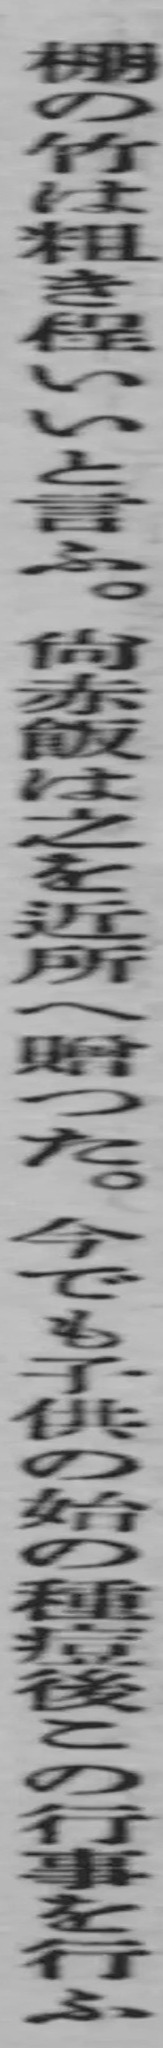棚の竹は粗き程いいと言ふ。尚赤飯は之を近所へ贈つた。今でも子供の始の種痘後この行事を行ふ
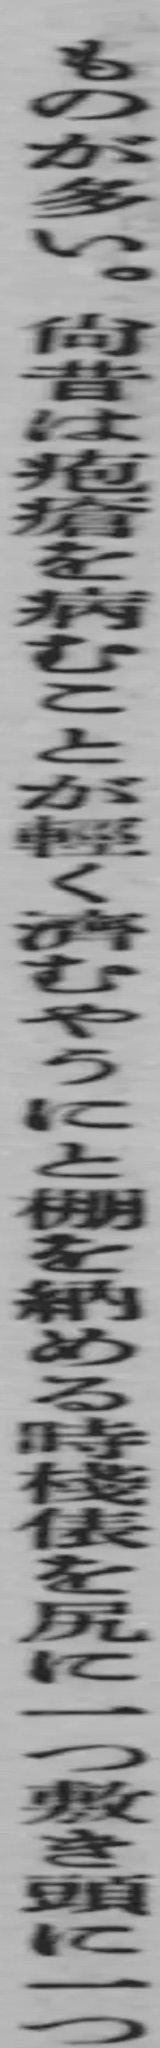ものが多い。尚昔は疱瘡を病むことが輕く濟むやうにと棚を納める時棧俵を尻に一つ敷き頭に一つ
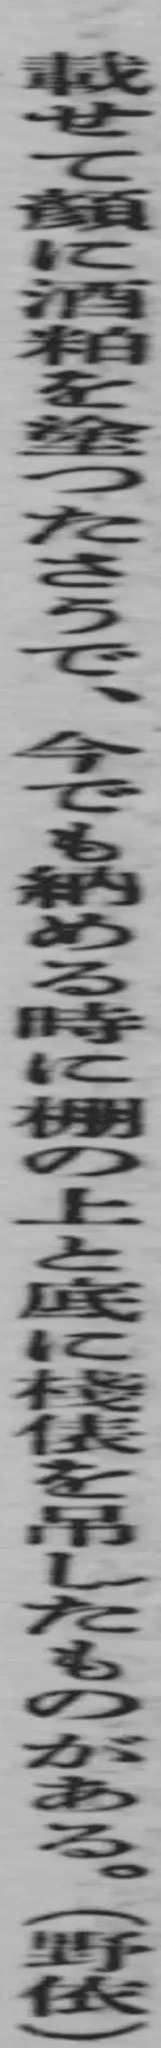載せて顏に酒粕を塗つたさうで、今でも納める時に棚の上と底に棧俵を吊したものがある。(野依)
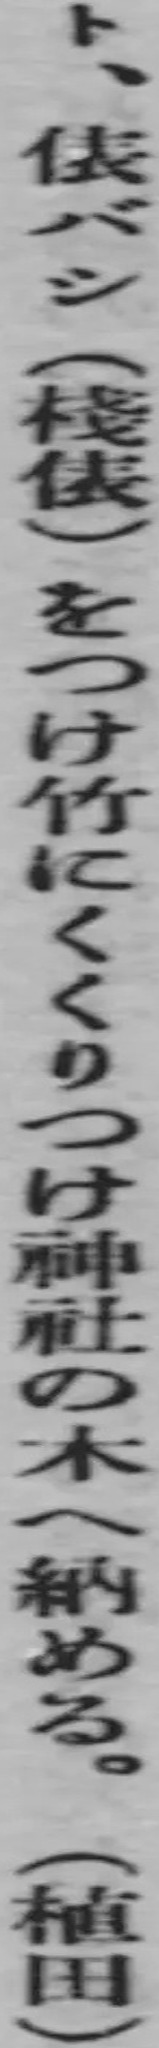ト、俵バシ(棧俵)をつけ竹にくくりつけ神社の木へ納める。(植田)
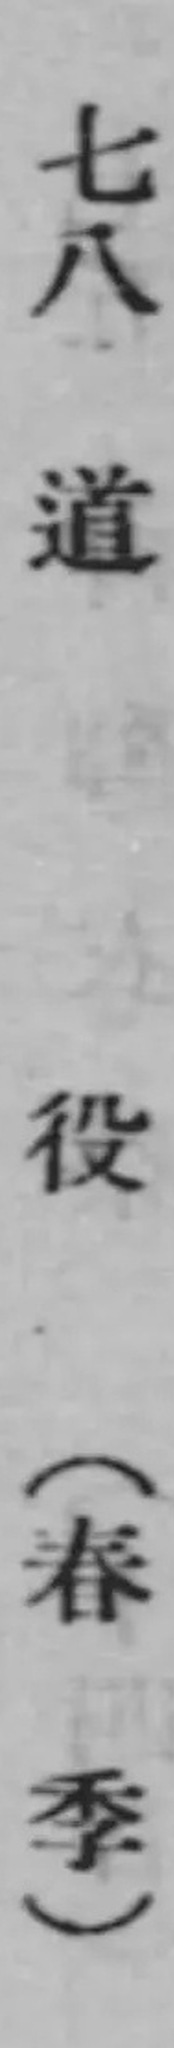七八道役(春季)
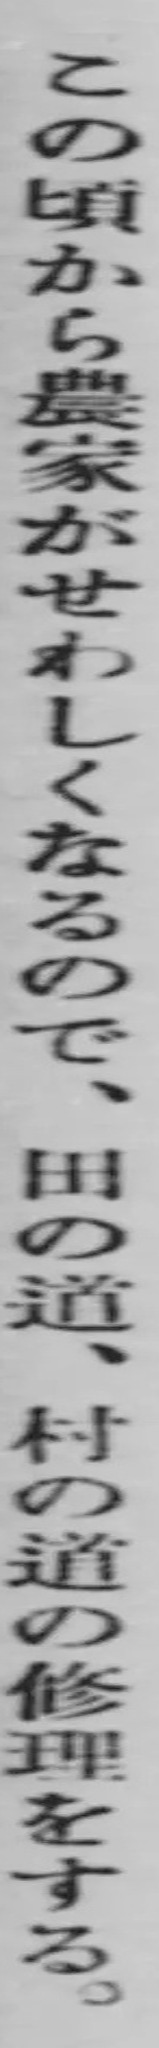この頃から農家がせわしくなるので、田の道、村の道の修理をする。
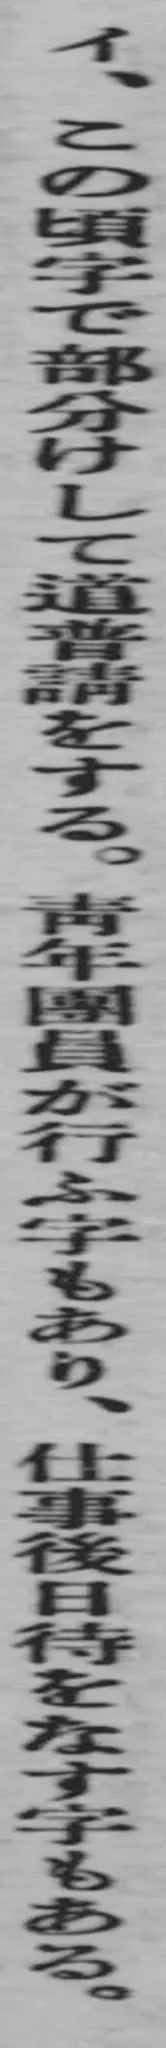イ、この頃字で部分けして道普請をする。靑年團員が行ふ字もあり、仕事後日待をなす字もある。
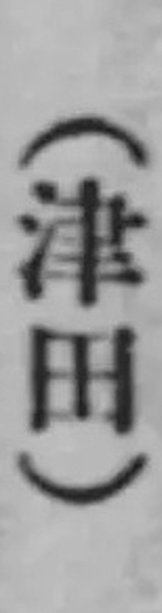(津田)
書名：豊橋の年中行事
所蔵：国立国会図書館 National Diet Library, JAPAN
